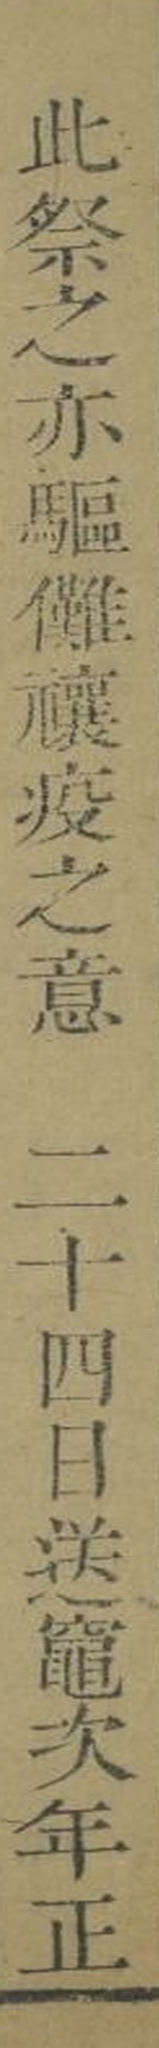此祭之亦駆儺禳疫之意二十四日送竈次年正
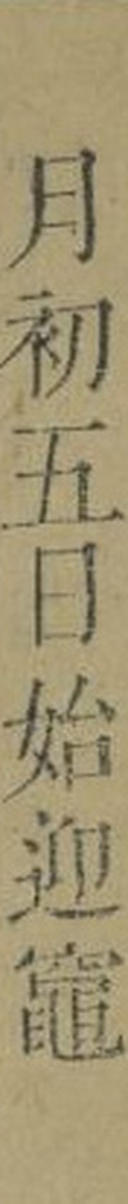月初五日始迎竈
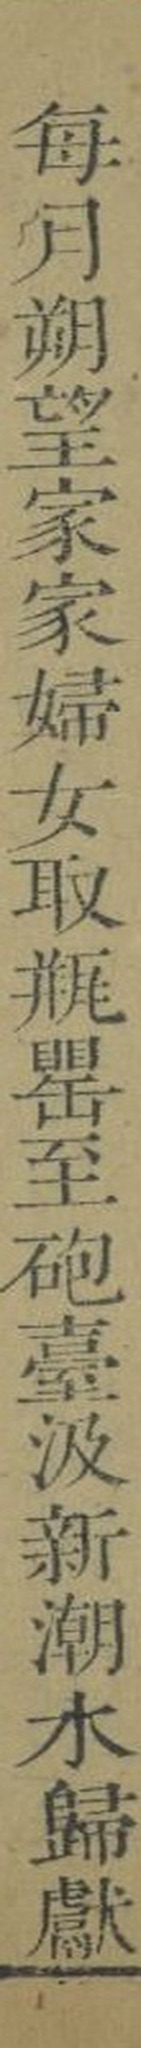毎月朔望家家婦女取瓶罌至砲台汲新潮水帰献
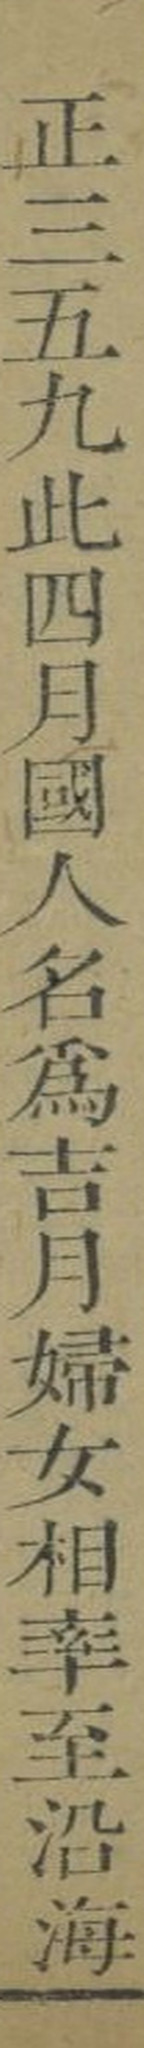正三五九此四月国人名為吉月婦女相率至沿海
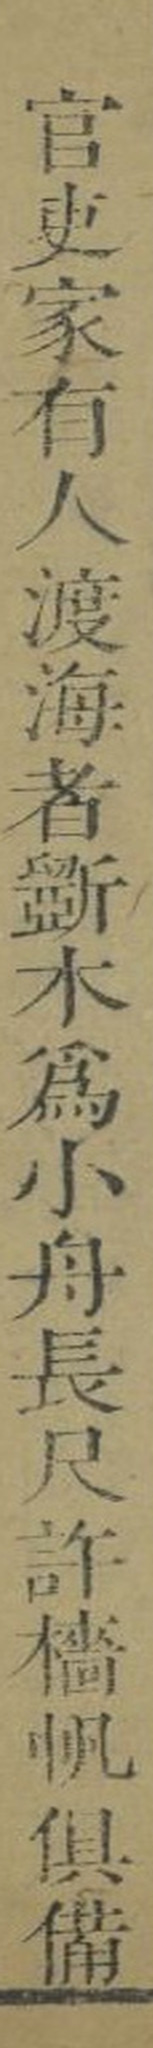官吏家有人渡海者斵木為小舟長尺許檣帆俱備
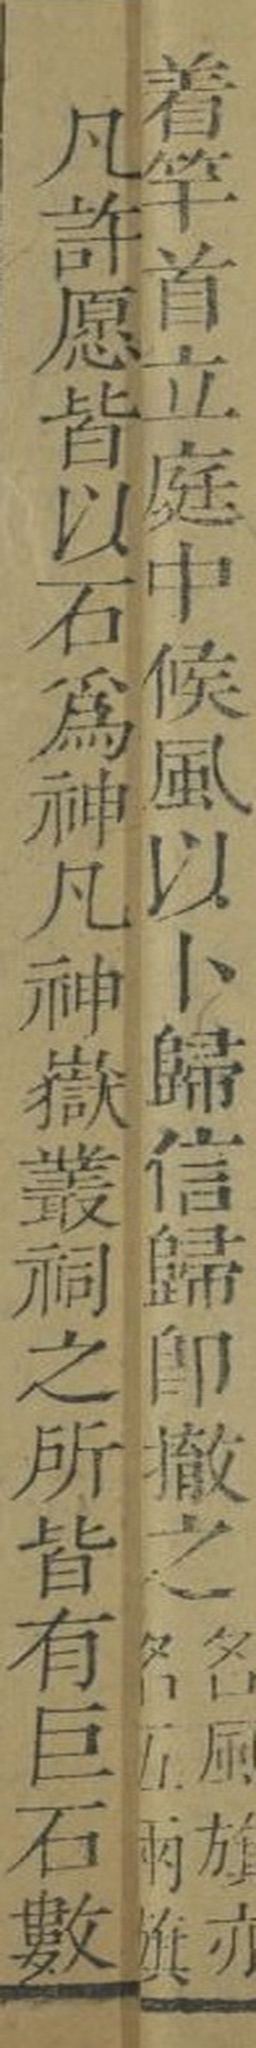凡許愿皆以石為神凡神岳叢祠之所皆有巨石数
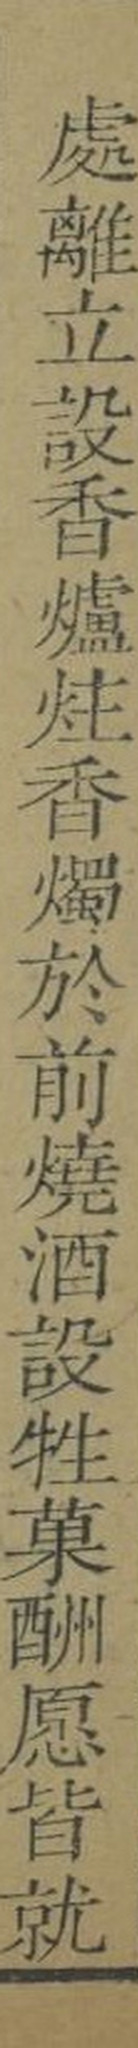処離立設香炉炷香燭於前焼酒設牲菓酬愿皆就
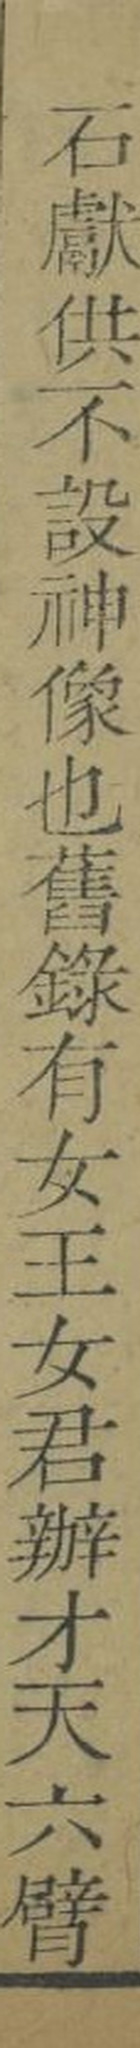石献供不設神像也旧録有女王女君弁才天六臂
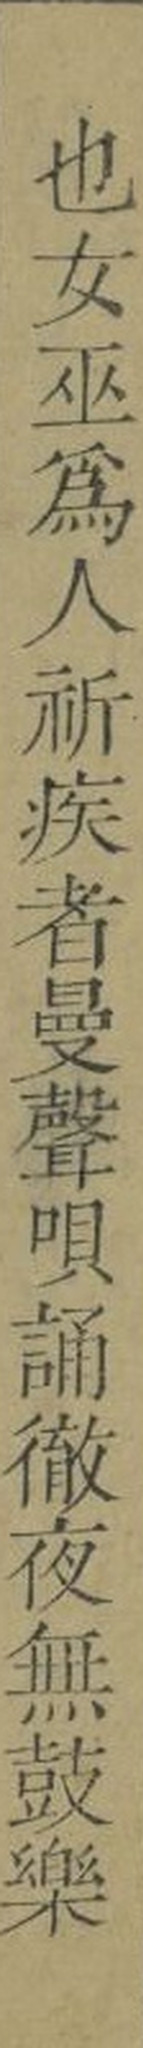也女巫為人祈疾者曼声唄誦徹夜無鼓楽
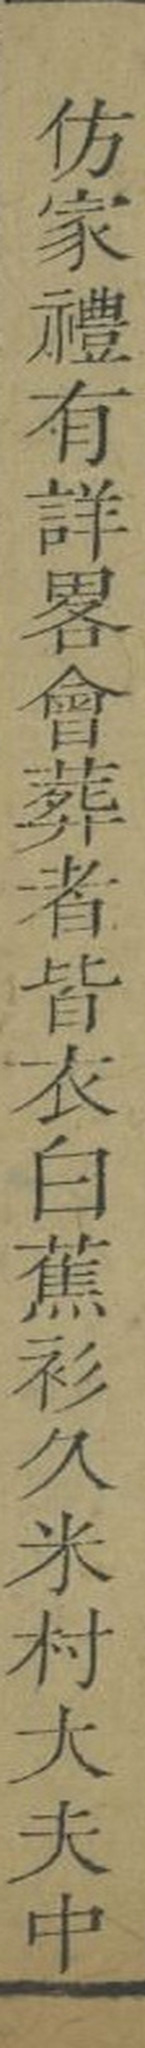仿家礼有詳略会葬者皆衣白蕉衫久米村大夫中
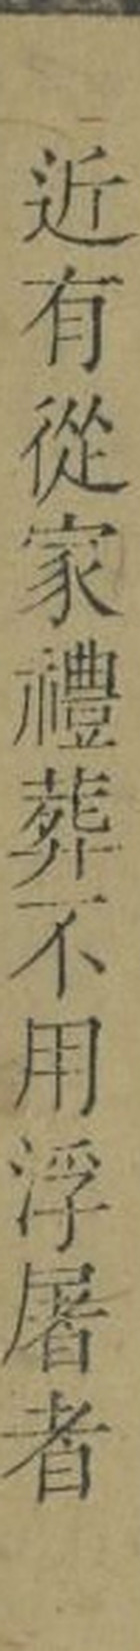近有従家礼葬不用浮屠者
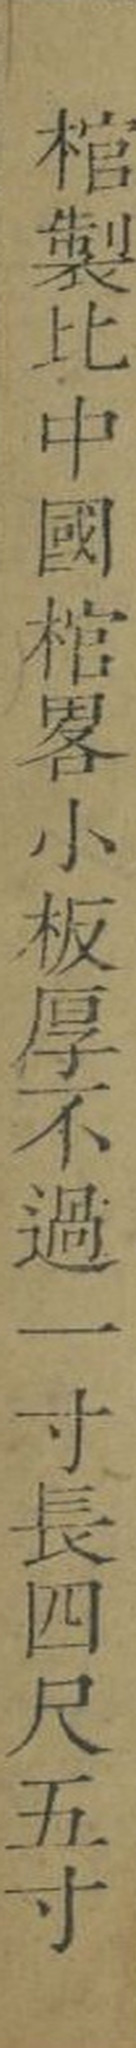棺製比中国棺略小板厚不過一寸長四尺五寸

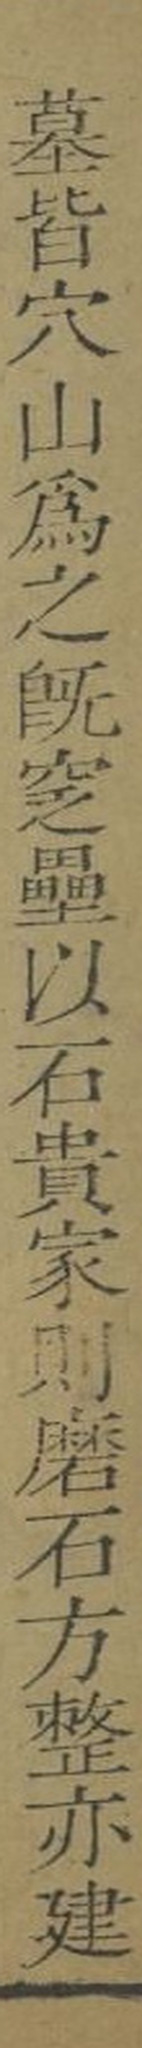墓皆穴山為之既窆壘以石貴家則磨石方整亦建
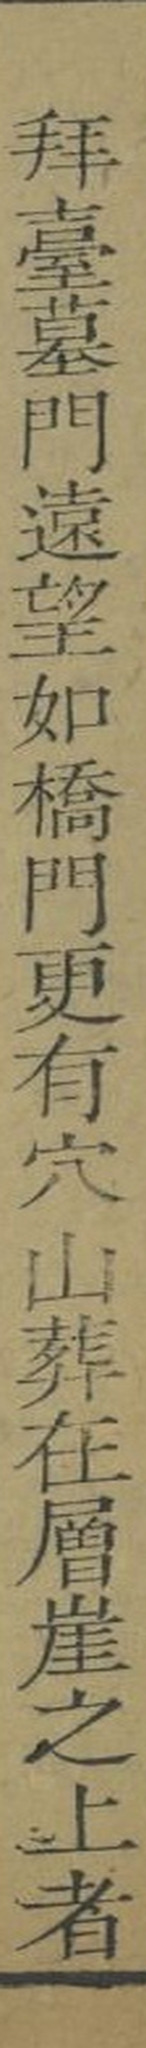拝台墓門遠望如橋門更有穴山葬在層崖之上者
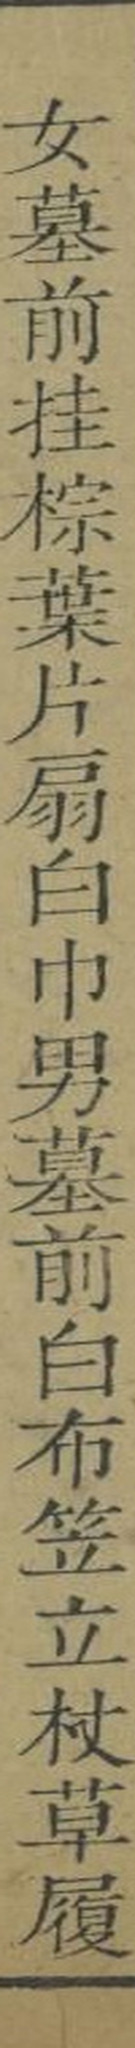女墓前挂棕葉片扇白巾男墓前白布笠立杖草履
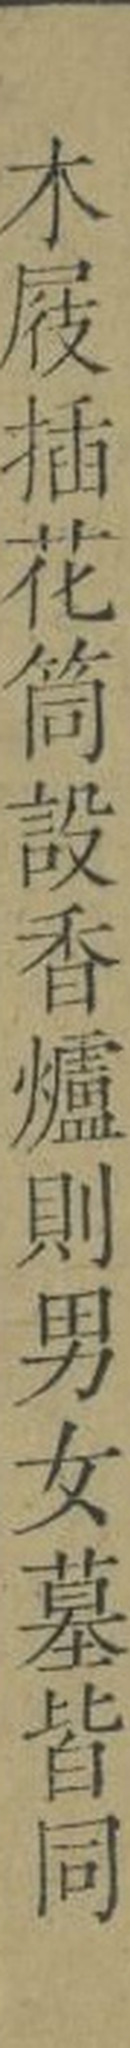木屐揷花筒設香炉則男女墓皆同
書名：中山伝信録 巻六
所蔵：University of the Ryukyus Library
